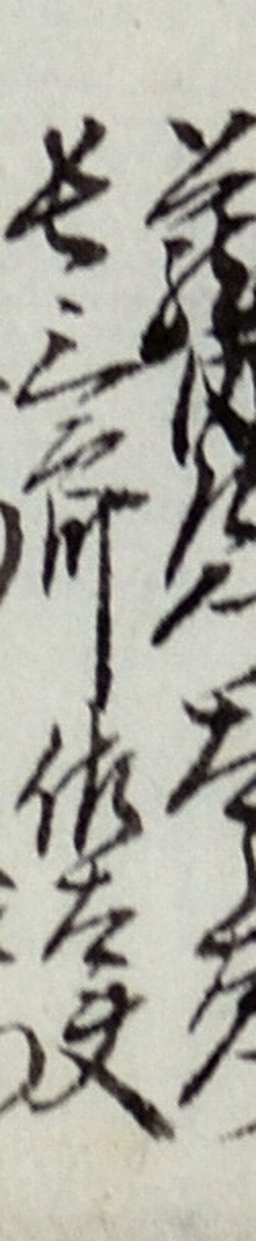長三郎佐太夫
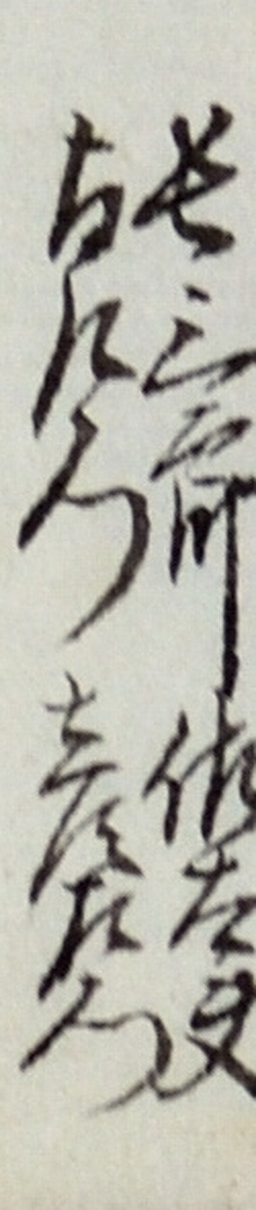与左衛門彦左衛門
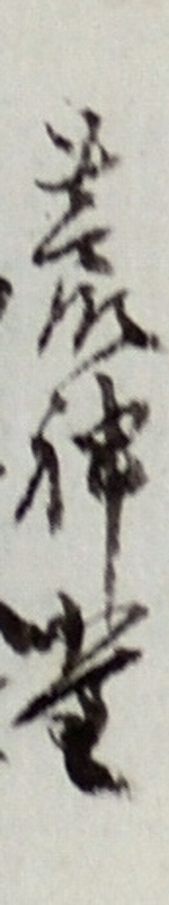荒神堂
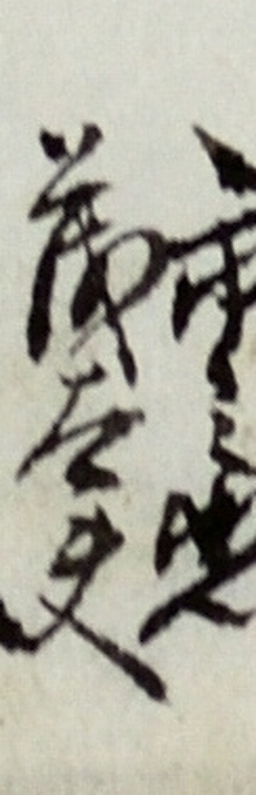茂太夫
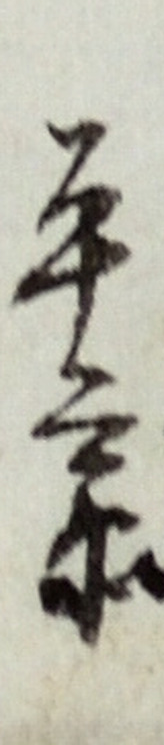平兵衛
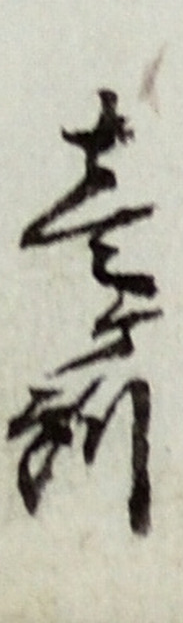壱ヶ所
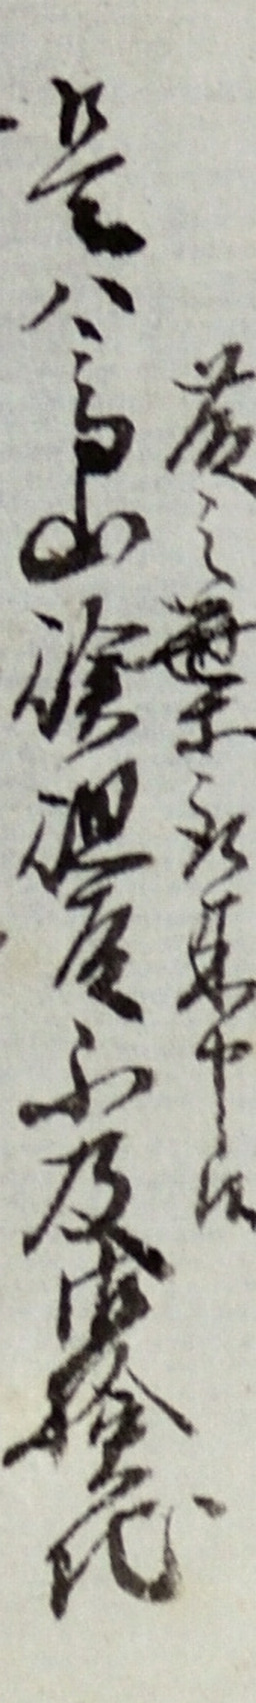是ハ高山嶮阻故不及御検地
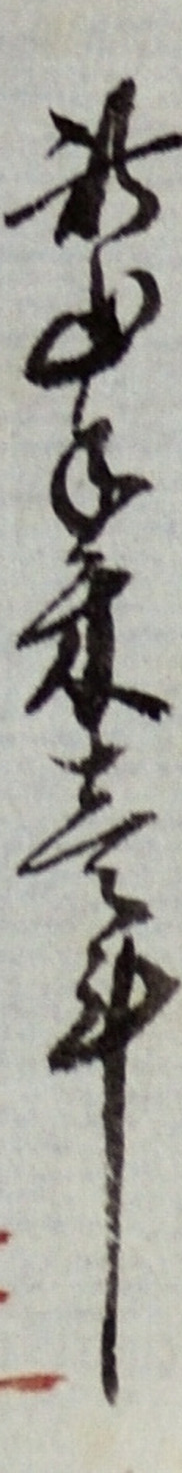此山手米壱斗

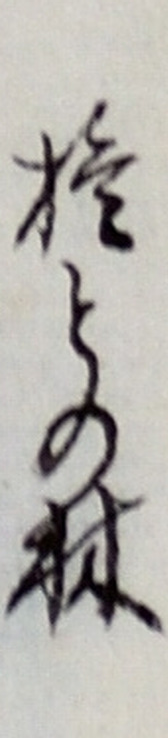権との林
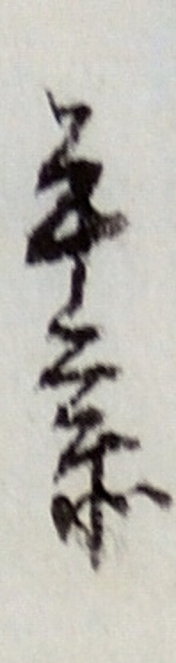勘兵衛
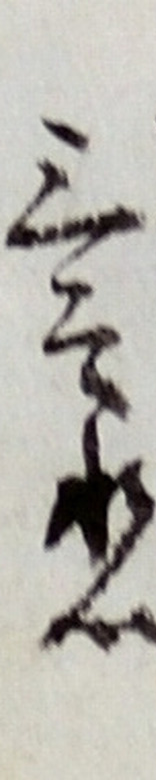三之丞
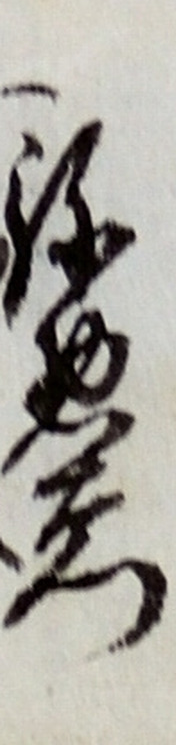弥五左衛門
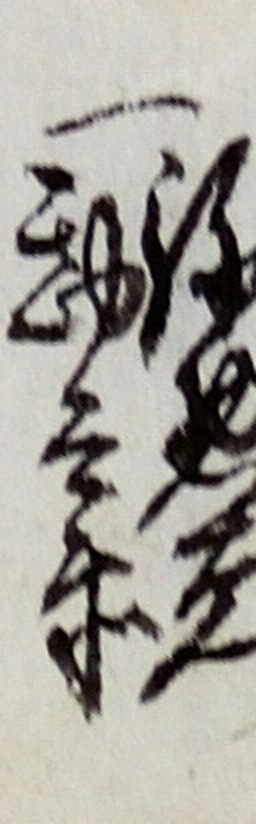勘兵衛
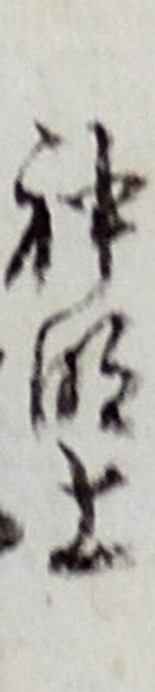神明上
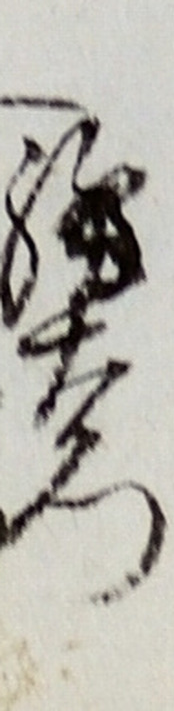孫右衛門
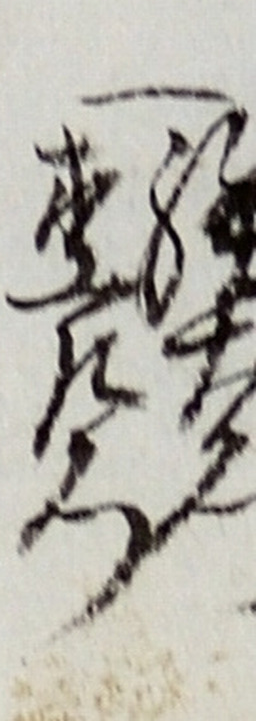杢左衛門
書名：御領分中山林社地手控
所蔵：伊那市立高遠町図書館・合同会社AMANE
